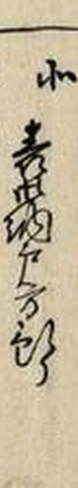北表御納戸方預り
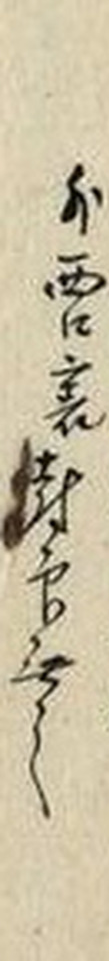外西口裏封印無之
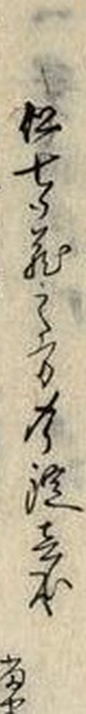但七つ蔵之方〆り錠壱本
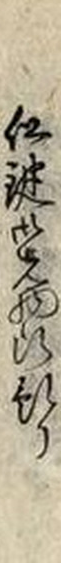但鍵御先物頭預り
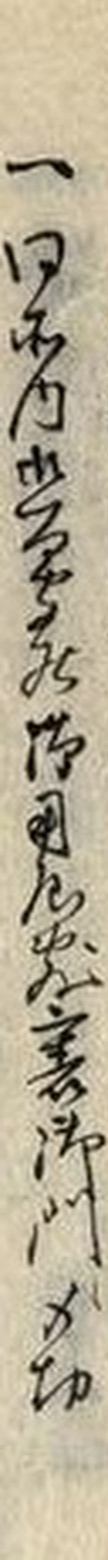一同所内御留守居御用屋敷裏御門〆切
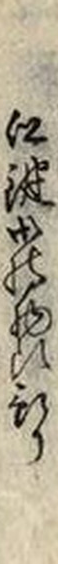但鍵御持物頭預り
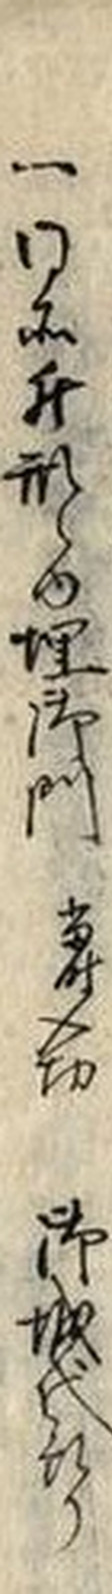一同所升形之内埋御門当時〆切御城代預り

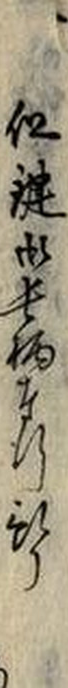但鍵御長柄奉行預り
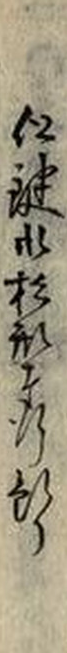但鍵御杉方奉行預り
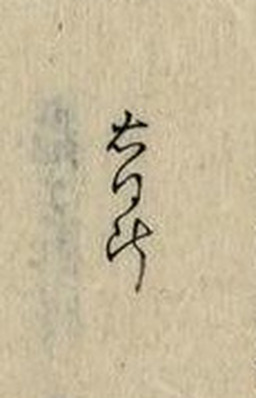但同断
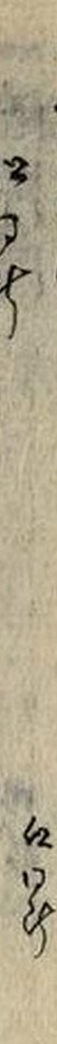但同断但同断
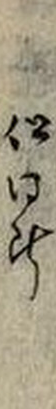但同断
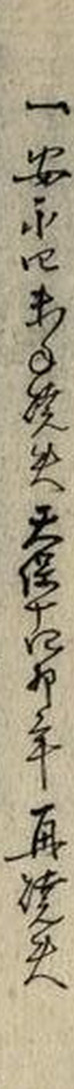一安永四未年焼失天保十四卯年再焼失
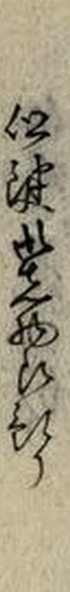但鍵御先物頭預り
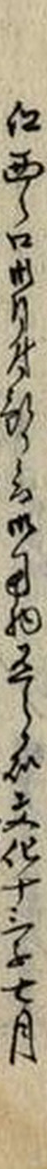但西之口御目付預りに而御用物有之候処文化十三子七月
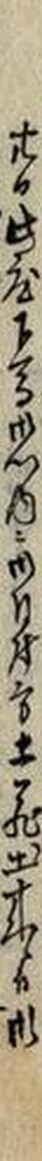廿日此度下馬御門内ニ御目付方土蔵出来候に付御
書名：御門御櫓之部
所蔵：福井県文書館 Fukui Prefectural Archives
